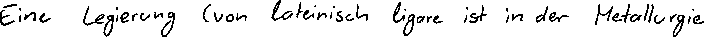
Eine Legierung (von lateinisch ligare ist in der Metallurgie
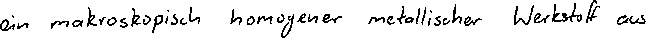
ein makroskopisch homogener metallischer Werkstoff aus
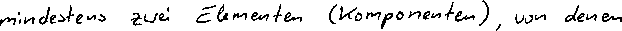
mindestens zwei Elementen (Komponenten), von denen
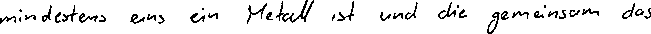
mindestens eins ein Metall ist und die gemeinsam das
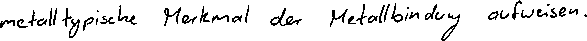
metalltypische Merkmal der Metallbindung aufweisen.
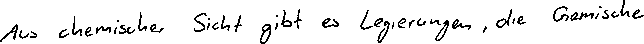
Aus chemischer Sicht gibt es Legierungen, die Gemische
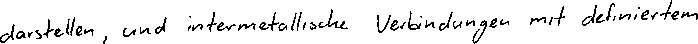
darstellen, und intermetallische Verbindungen mit definiertem
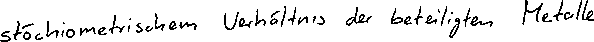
stöchiometrischem Verhältnis der beteiligten Metalle
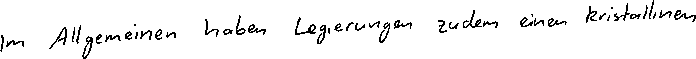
Im Allgemeinen haben Legierungen zudem einen kristallinen
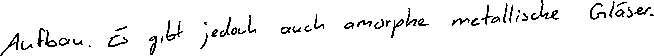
Aufbau. Es gibt jedoch auch amorphe metallische Gläser.
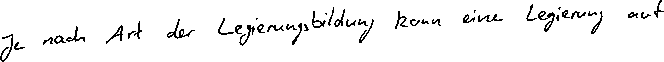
Je nach Art der Legierungsbildung kann eine Legierung auf
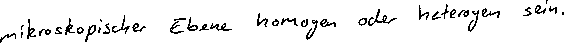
mikroskopischer Ebene homogen oder heterogen sein.
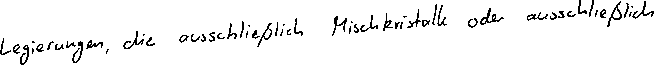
Legierungen, die ausschließlich Mischkristalle oder ausschließlich
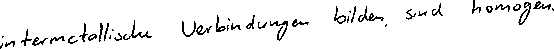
intermetallische Verbindungen bilden, sind homogen.
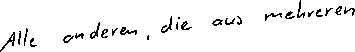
Alle anderen, die aus mehreren
